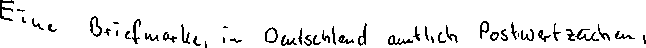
Eine Briefmarke, in Deutschland amtlich Postwertzeichen,
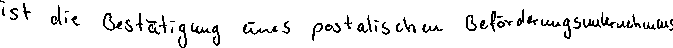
ist die Bestätigung eines postalischen Beförderungsunternehmens
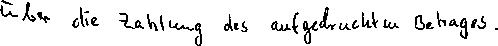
über die Zahlung des aufgedruckten Betrages.
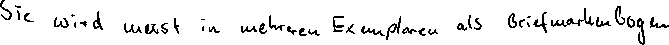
Sie wird meist in mehreren Exemplaren als Briefmarkenbogen
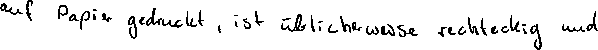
auf Papier gedruckt, ist üblicherweise rechteckig und
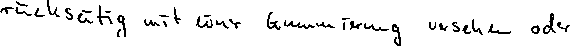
rückseitig mit einer Gummierung versehen oder
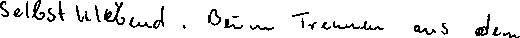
selbstklebend. Beim Trennen aus dem
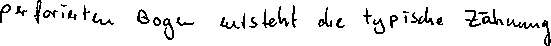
perforierten Bogen entsteht die typische Zähnung
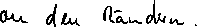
an den Rändern.
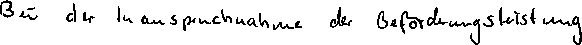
Bei der Inanspruchnahme der Beförderungsleistung
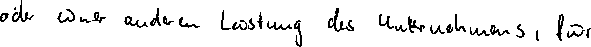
oder einer anderen Leistung des Unternehmens, für
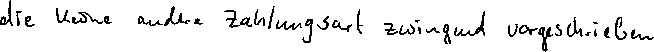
die keine andere Zahlungsart zwingend vorgeschrieben
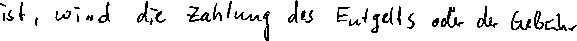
ist, wird die Zahlung des Entgelts oder der Gebühr
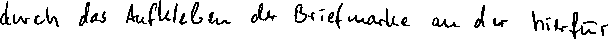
durch das Aufkleben der Briefmarke an der hierfür
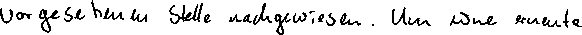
vorgesehenen Stelle nachgewiesen. Um eine erneute
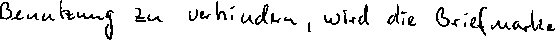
Benutzung zu verhindern, wird die Briefmarke
